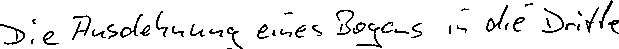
Die Ausdehnung eines Bogens in die Dritte
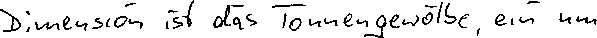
Dimension ist das Tonnengewölbe, ein um
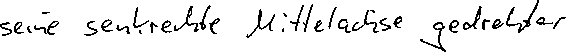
seine senkrechte Mittelachse gedrehter
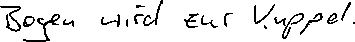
Bogen wird zur Kuppel.
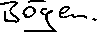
Bögen
